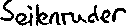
Seitenruder
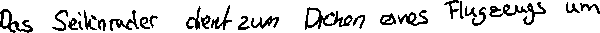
Das Seitenruder dient zum Drehen eines Flugzeugs um
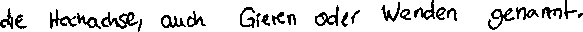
die Hochachse, auch Gieren oder Wenden genannt.
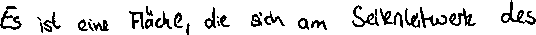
Es ist eine Fläche, die sich am Seitenleitwerk des
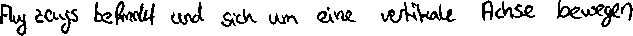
Flugzeugs befindet und sich um eine vertikale Achse bewegen
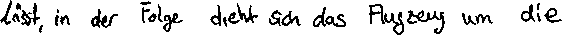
lässt, in der Folge dreht sich das Flugzeug um die
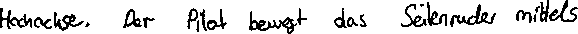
Hochachse. Der Pilot bewegt das Seitenruder mittels
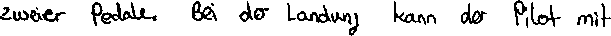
zweier Pedale. Bei der Landung kann der Pilot mit
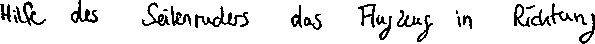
Hilfe des Seitenruders das Flugzeug in Richtung
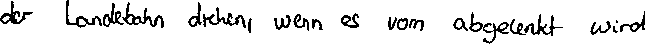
der Landebahn drehen, wenn es vom Seitenwind abgelenkt wird.
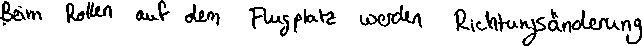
Beim Rollen auf dem Flugplatz werden Richtungsänderung
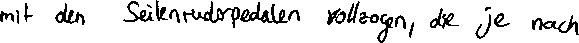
mit den Seitenruderpedalen vollzogen, die je nach
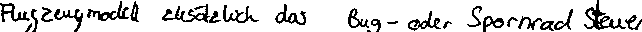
Flugzeugmodell zusätzlich das Bug- oder Spornrad steuer
